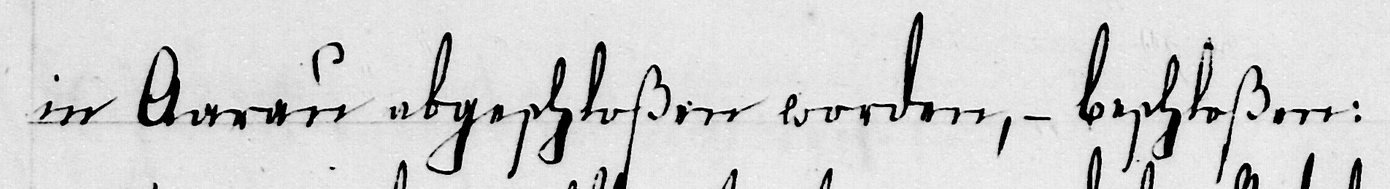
in Aarau abgeschloßen worden, – beschloßen:
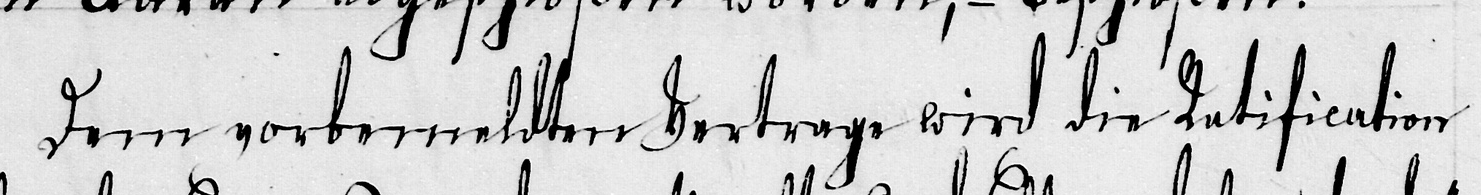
Dem vorbemeldten Vertrage wird die Ratification
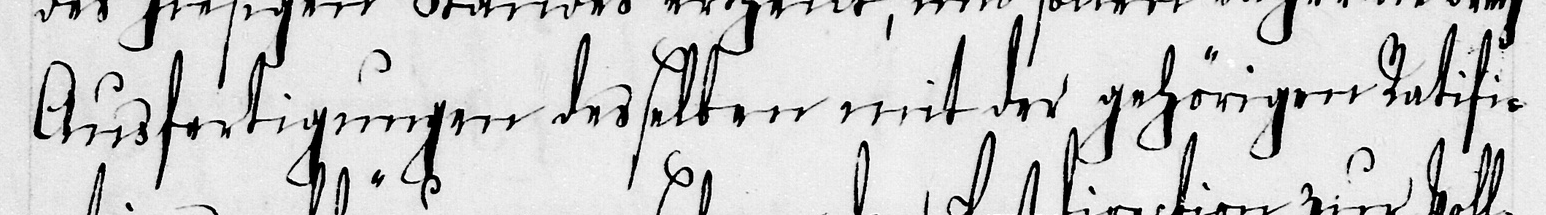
Ausfertigungen desselben mit der gehörigen Ratifi¬
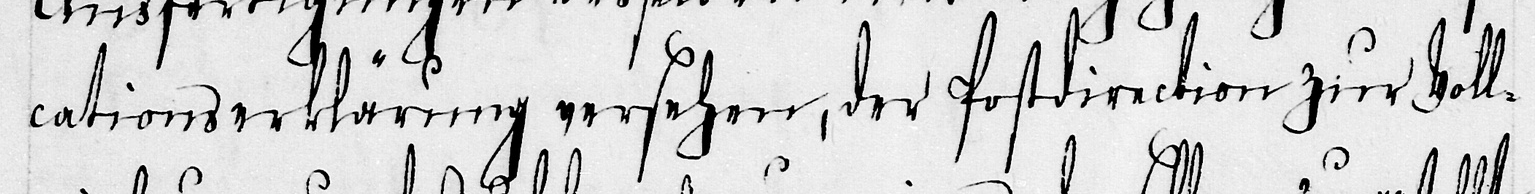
cationserklärung versehen, der Postdirection zur Voll¬
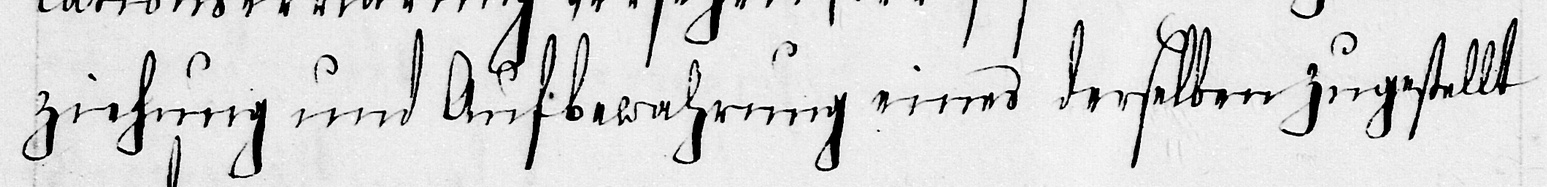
ziehung und Aufbewahrung eines derselben zugestellt
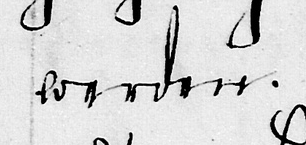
werden.
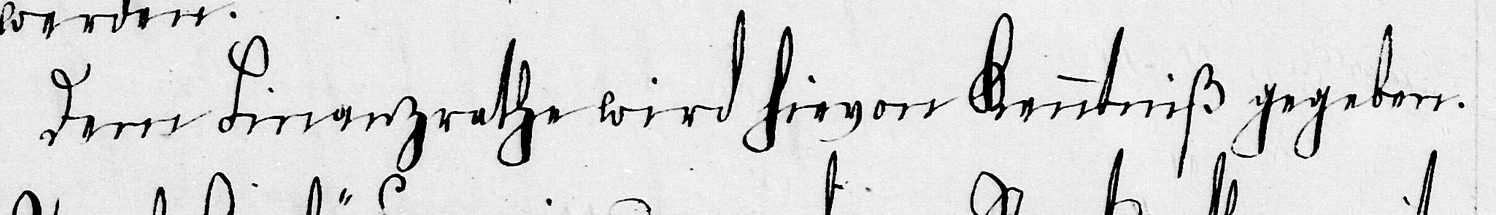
Dem Finanzrathe wird hievon Kenntniß gegeben.
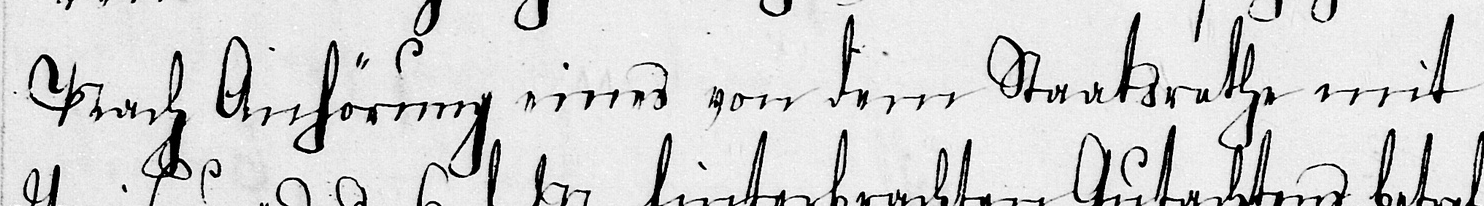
Nach Anhörung eines von dem Staatsrathe mit
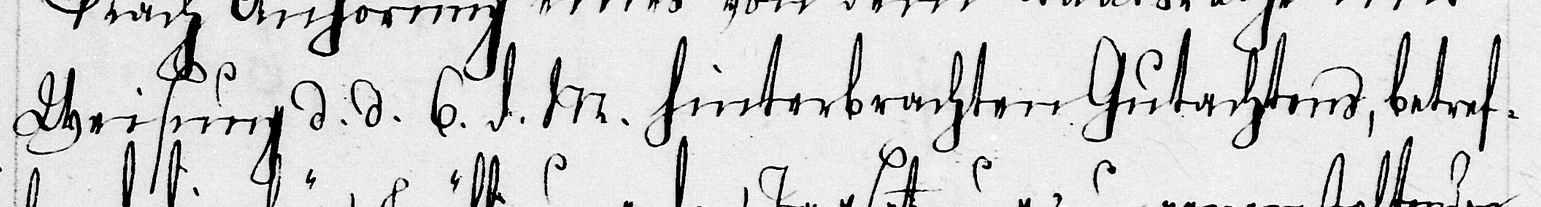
Weisung d. d. 6. d. M. hinterbrachten Gutachtens, betref¬
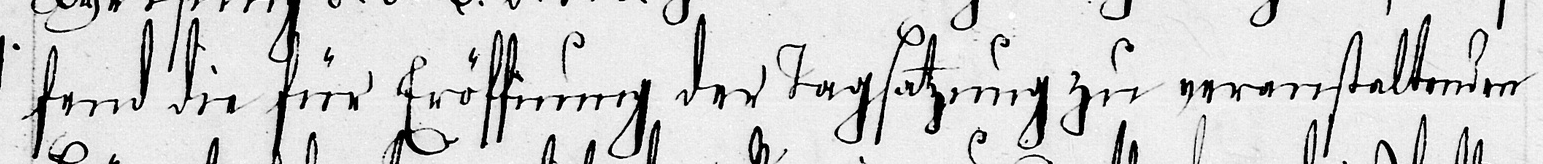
fend die für Eröffnung der Tagsatzung zu veranstaltenden
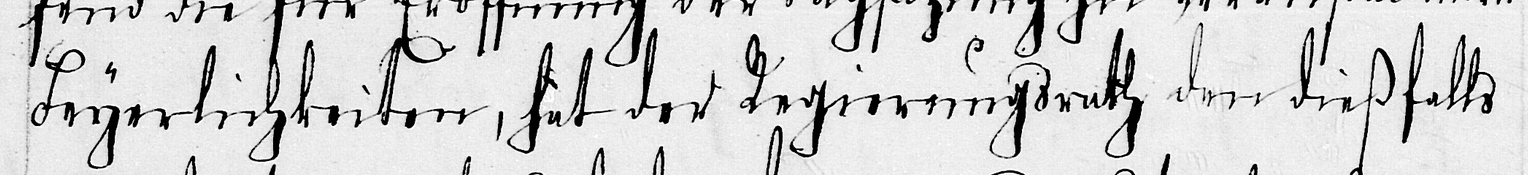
Feyerlichkeiten, hat der Regierungsrath den dießfalls
